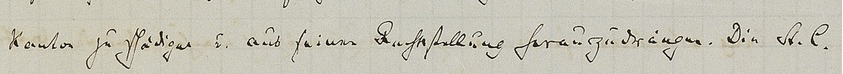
Kanton zu schädigen u. aus seiner Rechtsstellung herauszudrängen. Die St.C.
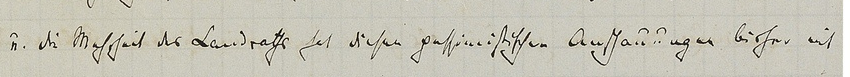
u. die Mehrheit des Landraths hat diesen pessimistischen Anschauungen bisher mit
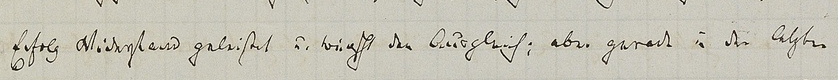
Erfolg Widerstand geleistet u. wünscht den Ausgleich; aber gerade in der letzten
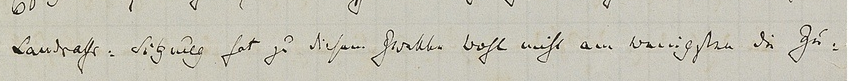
Landraths-Sitzung hat zu diesem Zwekke wohl nicht am wenigsten die Zu-
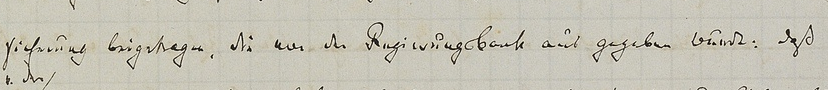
sicherung beigetragen, die von der Regierungsbank aus gegeben wurde: daß
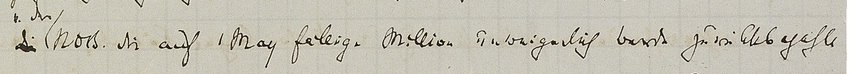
der NOB. die auf 1 May fällige Million unweigerlich werde zurükkbezahlt
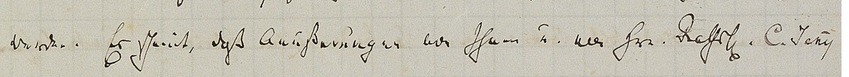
werden. Es scheint, daß Aeußerungen von Ihnen u. von Hrn. Rathsh. C. Jenny
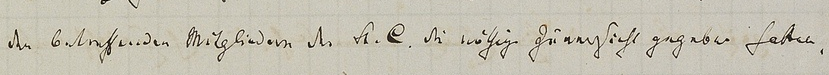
den betreffenden Mitgliedern der St.C. die nöthige Zuversicht gegeben hatten,
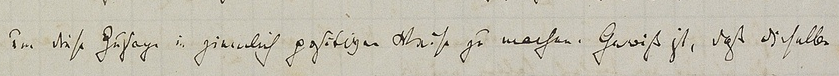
um diese Zusage in ziemlich positiver Weise zu machen. Gewiß ist, daß dieselbe
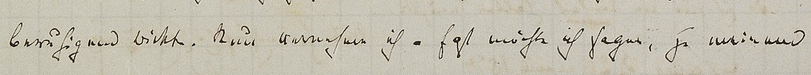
beruhigend wirkte. Nun vernehme ich – fast möcht ich sagen, zu meinem
